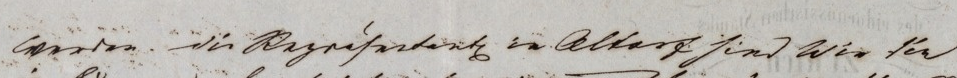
werden. Die Repräsentanten in Altorf sind wie die
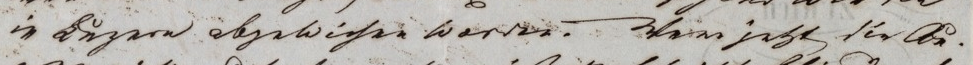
in Luzern abgewiesen worden. Wem jetzt die Au-
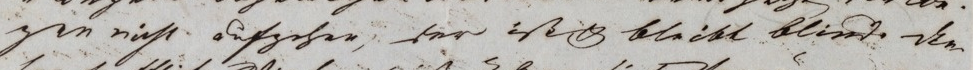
gen nicht aufgehen, der ist & bleibt blind. Die-
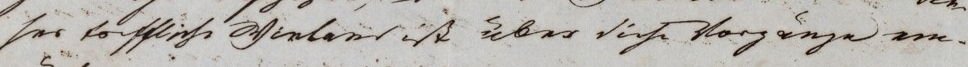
ser treffliche Wieland ist über diese Vorgänge em-
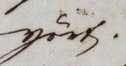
pört.
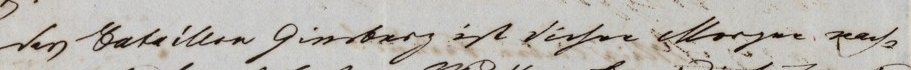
Das Bataillon Ginsberg ist diesen Morgen nach-
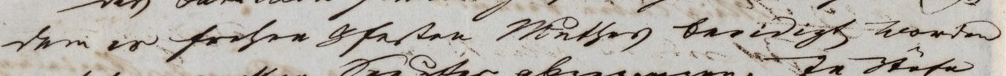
dem es frohen & festen Muthes beeidigt worden
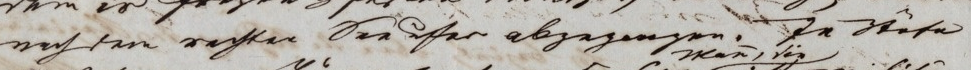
nach dem rechten Seeufer abgegangen. In Stäfa
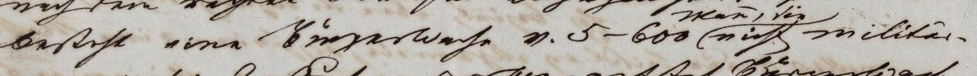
besteht eine Bürgerwache v. 5–600 Mann, die nicht militär-
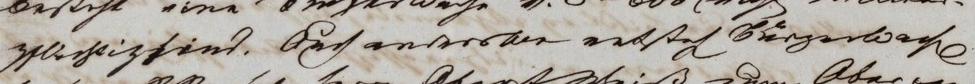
pflichtig sind. Auch anderswo entstehen Bürgerwachen
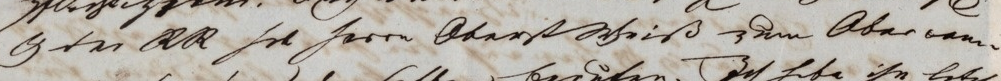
& der RR hat Herrn Oberst Weiß zum Obercom-
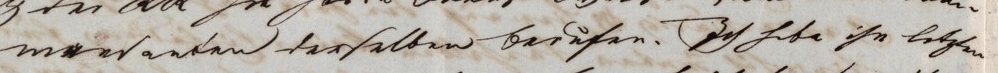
mandanten derselben berufen. Ich habe ihn letzten
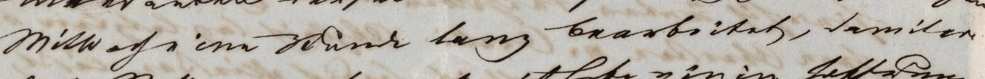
Mittwoch eine Stunde lang bearbeitet, damit er
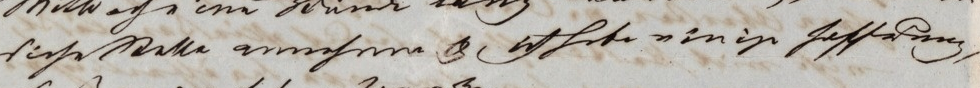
diese Stelle annehme & ich habe einige Hoffnung,
